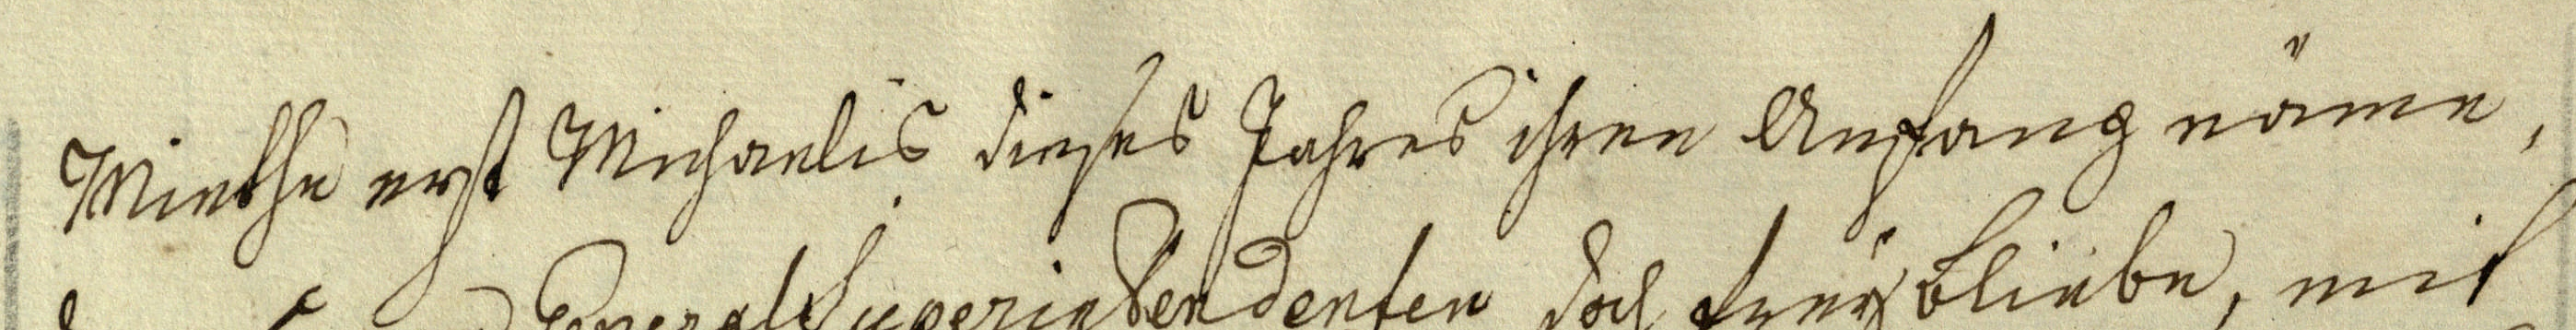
Miethe erst Michaelis dieses Jahres ihren Anfang näme,
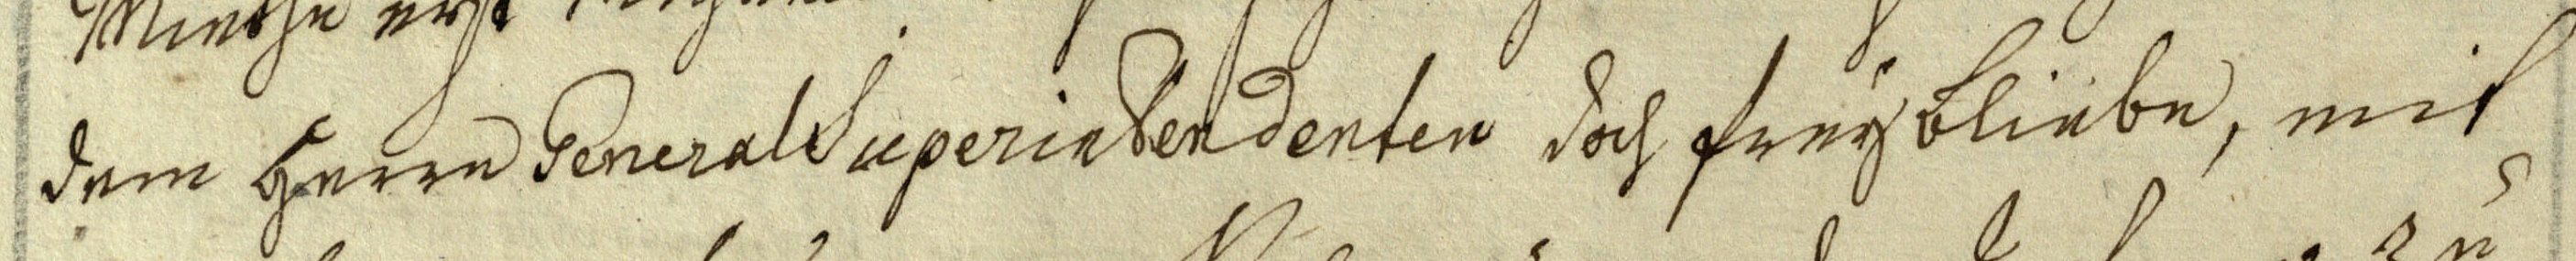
dem Herrn GeneralSuperintendenten doch freÿ bliebe, mit
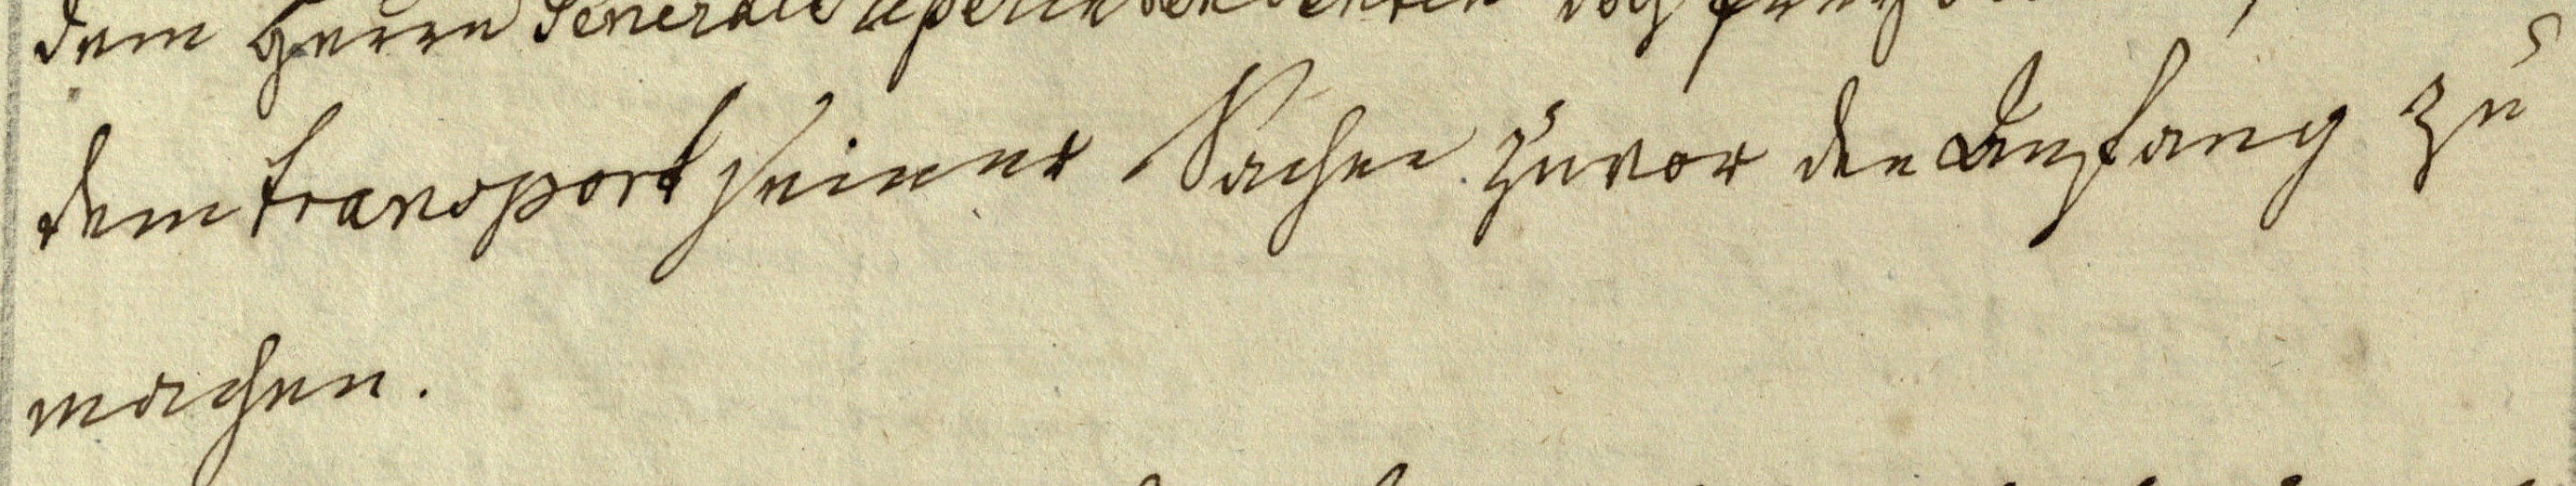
dem Transport seiner Sachen zuvor den Anfang zu
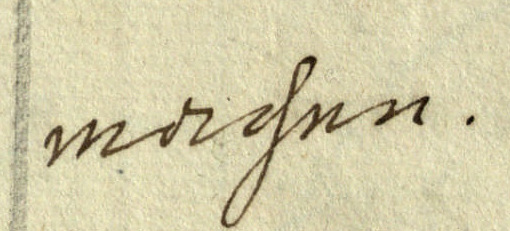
machen.
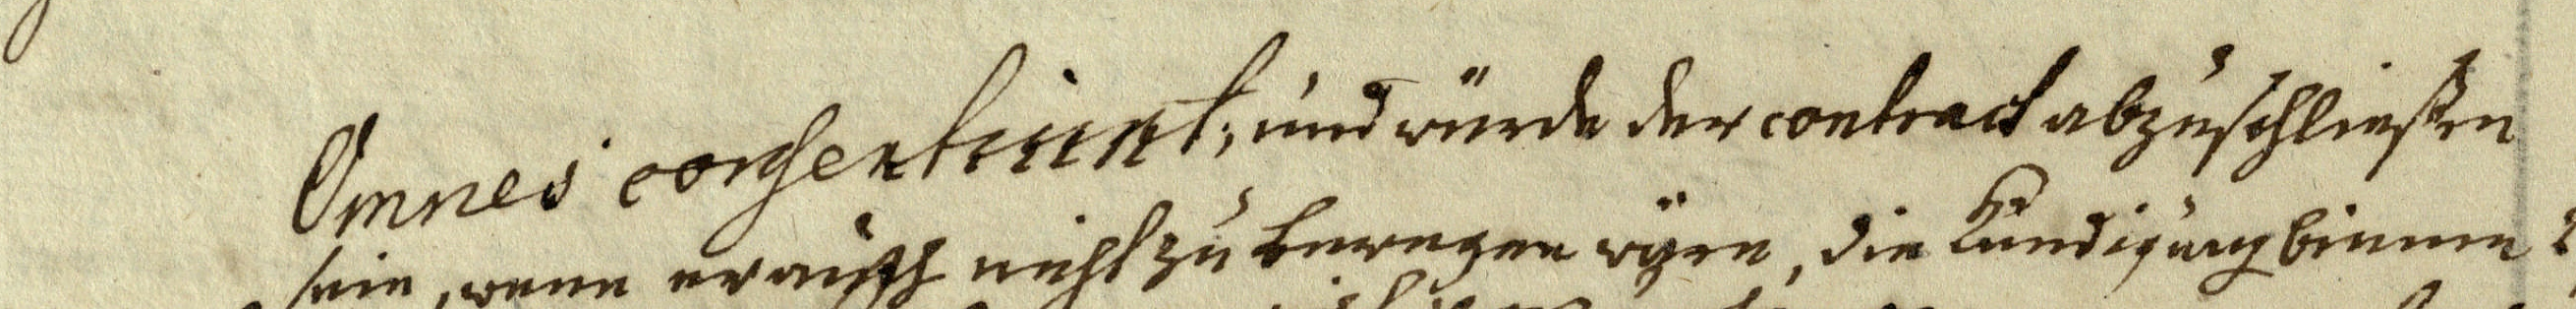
Omnes consentinet und würde der contract abzuschließen
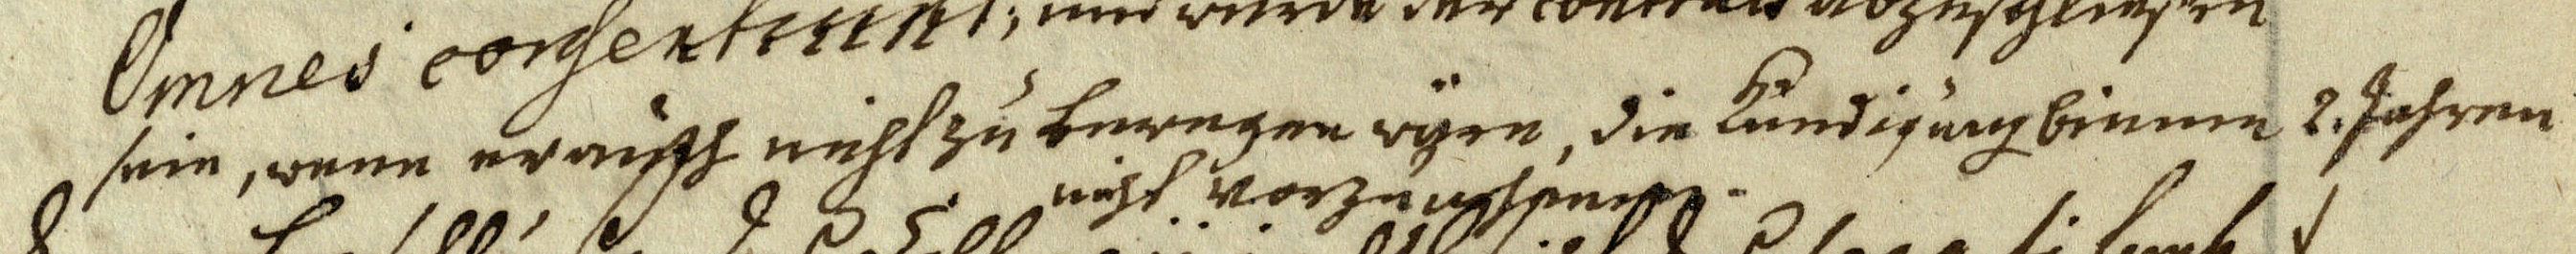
sein, wenn er auch nicht zu bewegen wäre, die Kündigung binnen 2. Jahren nicht vorzunehmen.
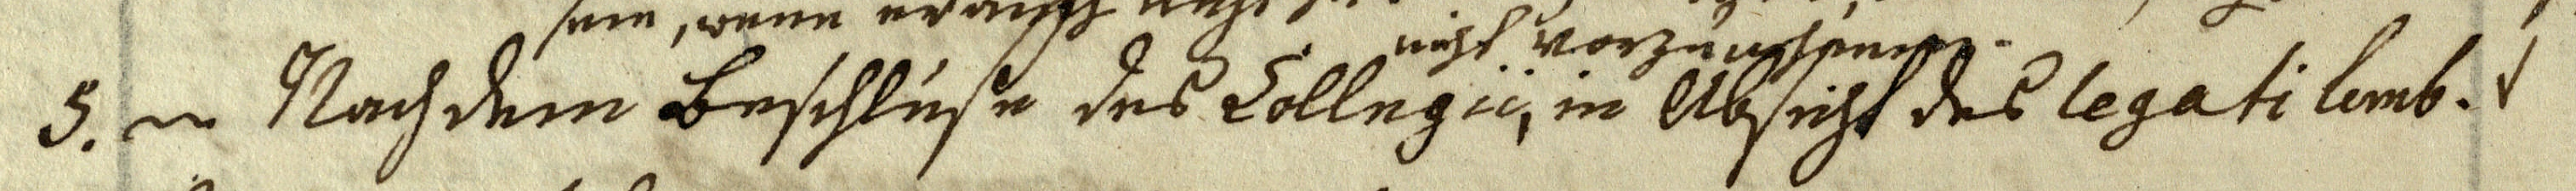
5. Nach dem Beschluße des Collegii in Absicht des legati Lemb¬
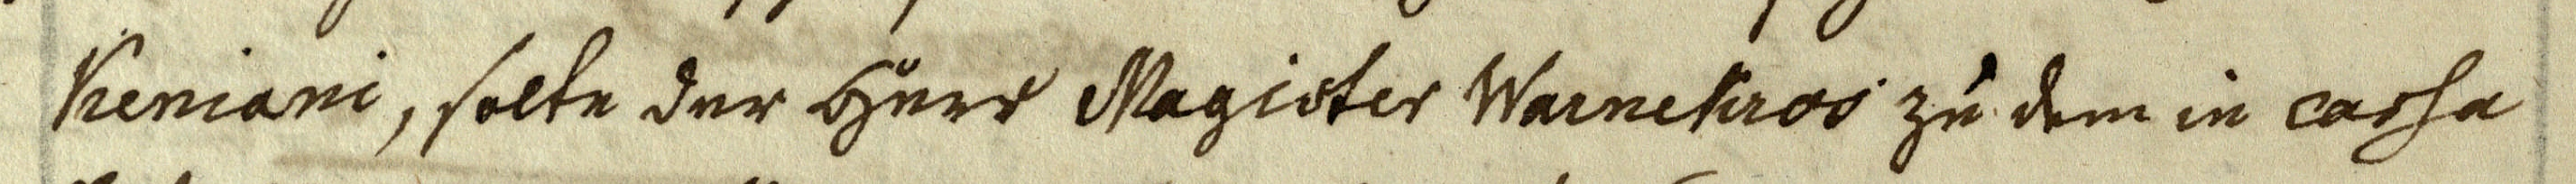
keniani, solte der Herr Magister Warnekros zu dem in cassa
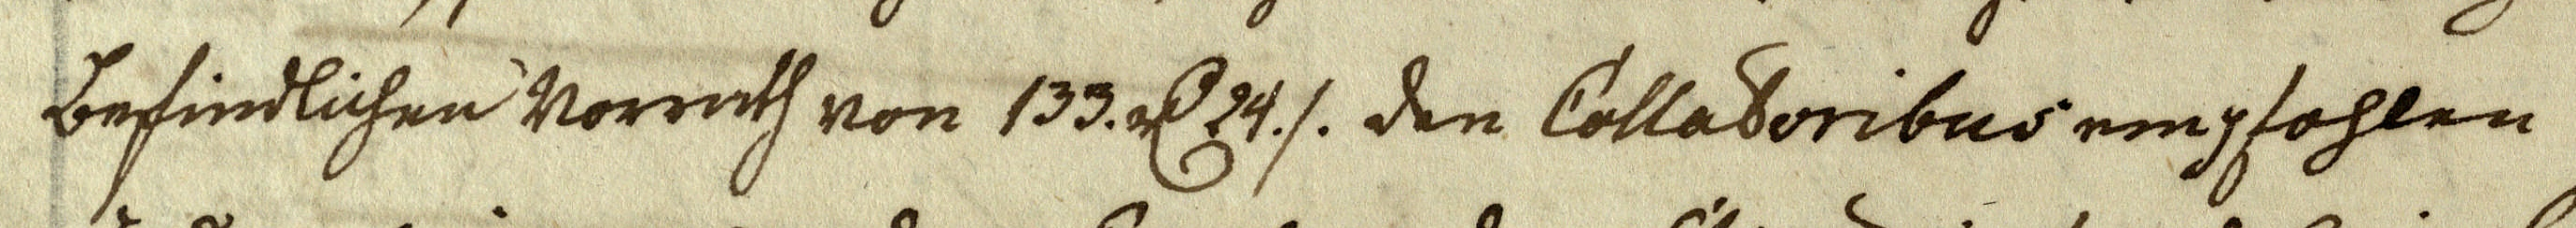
befindlichen Vorrath von 133r. 24. s. den Collatoribus empfohlen
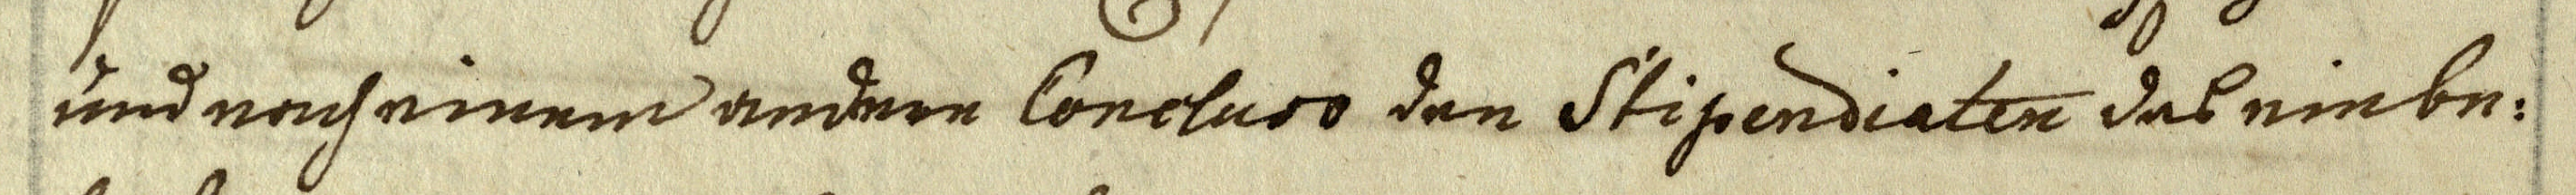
und nach einem andern Concluso den Stipendiaten das einbe¬
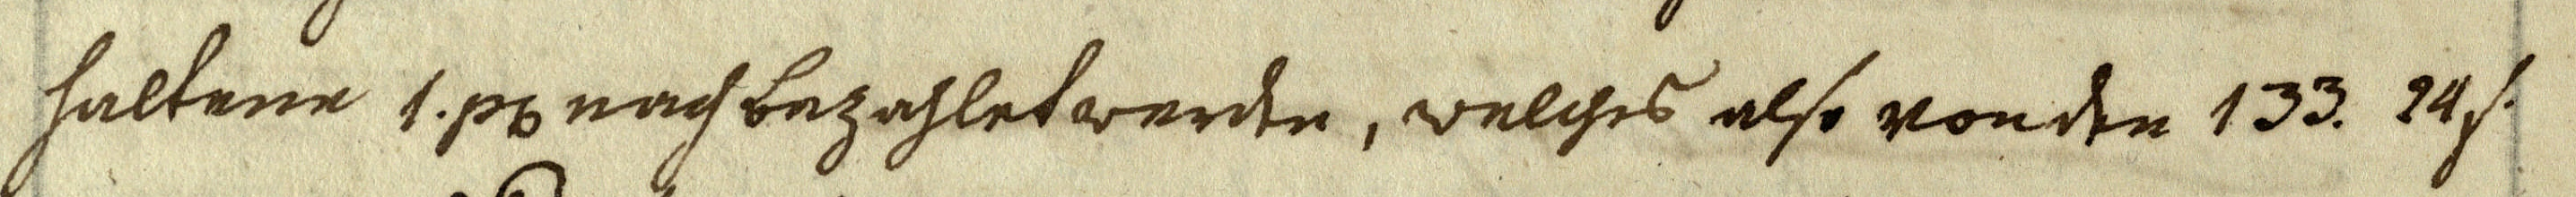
haltene 1p. nach bezahlet werden, welches also von den 133. 24 s.
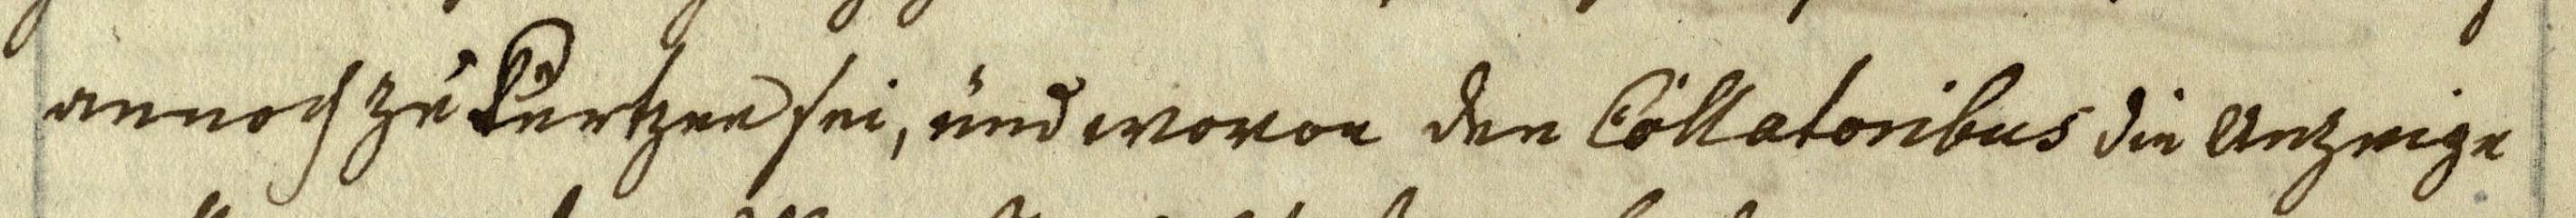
annoch zu kürtzen sei, und wovon den Collatoribus die Anzeige
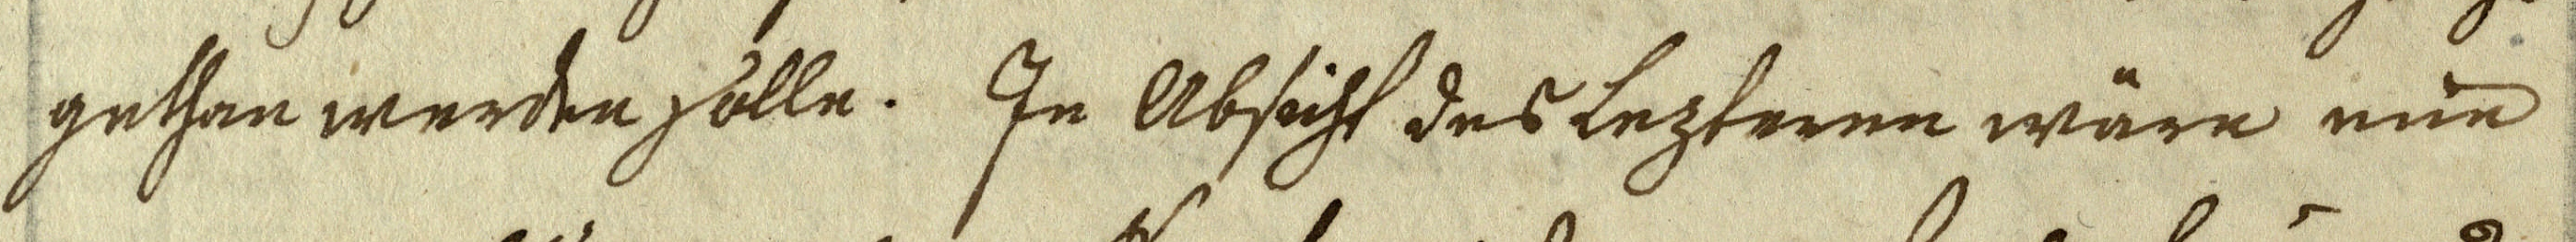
gethan werden solle. In Absicht des Lezteren wäre nun
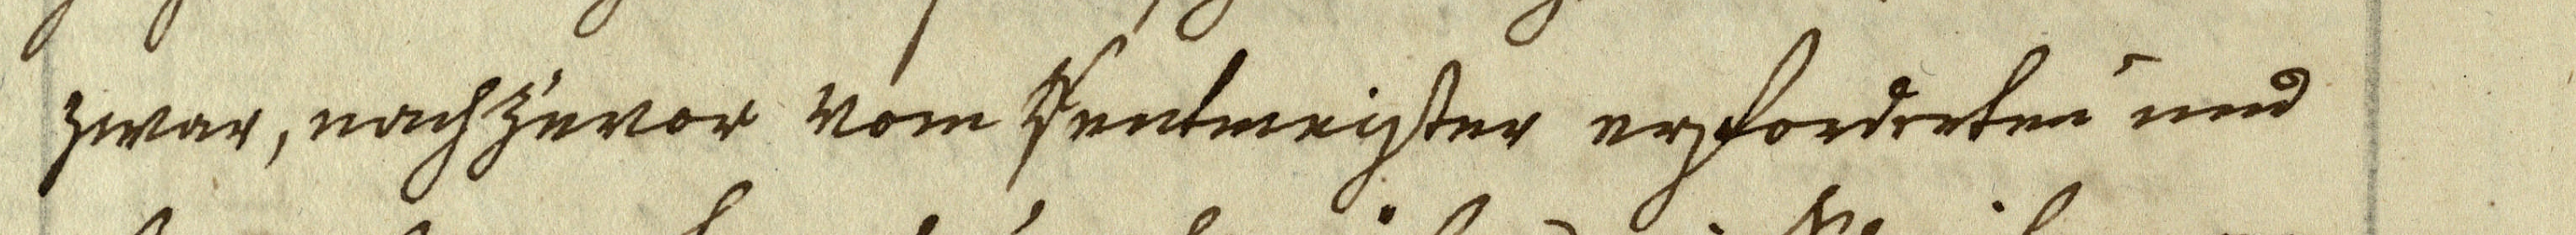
zwar, nach zuvor vom Rentmeister erforderten und
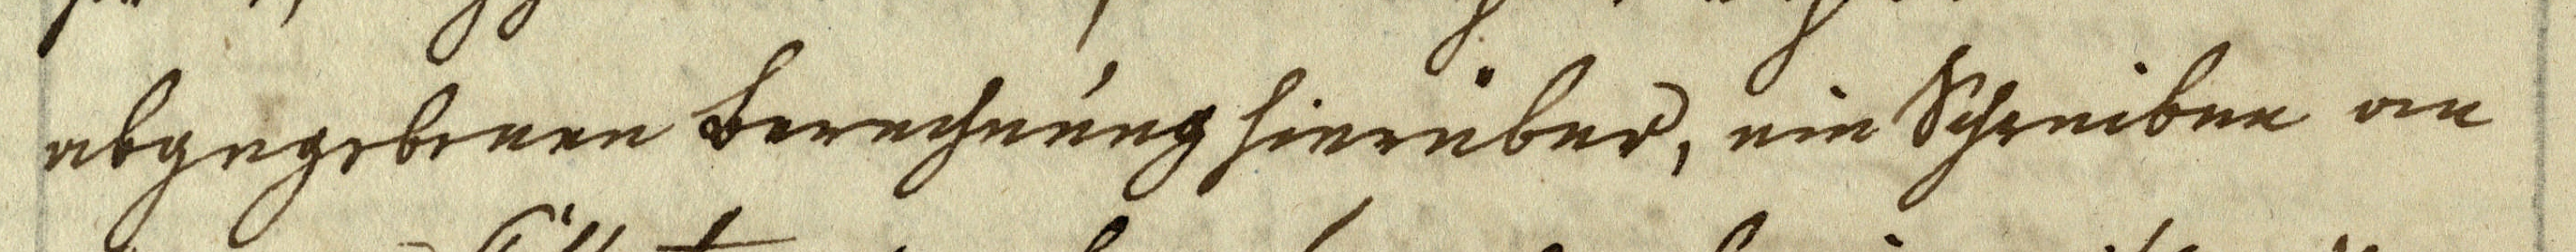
abgegebenen Berechnung hierüber, ein Schreiben an
